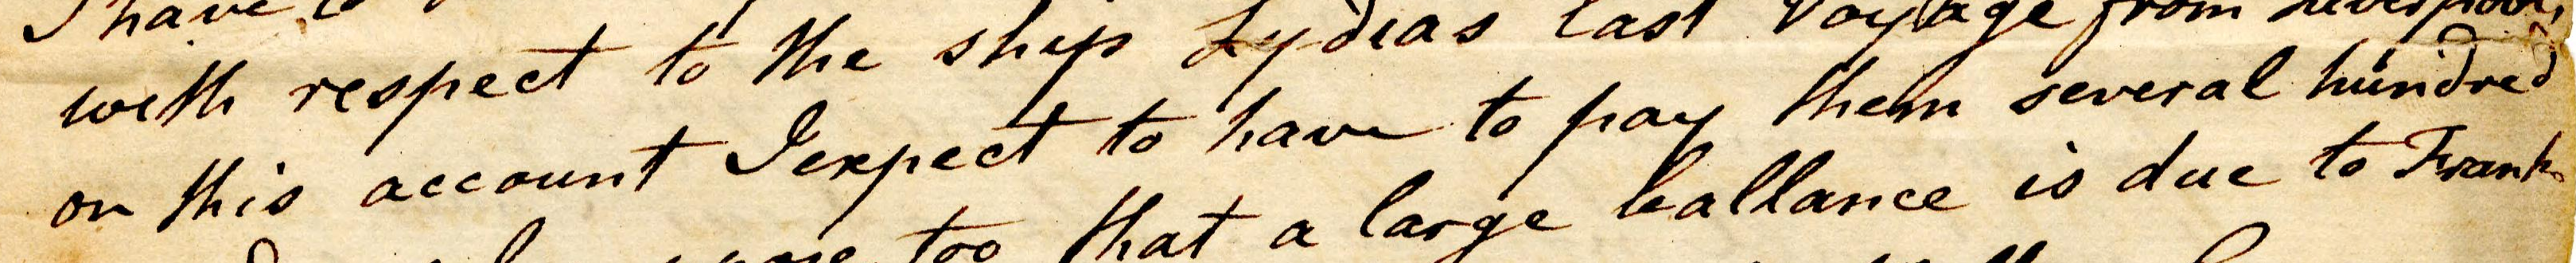on this account I expect to have to pay them several hundred
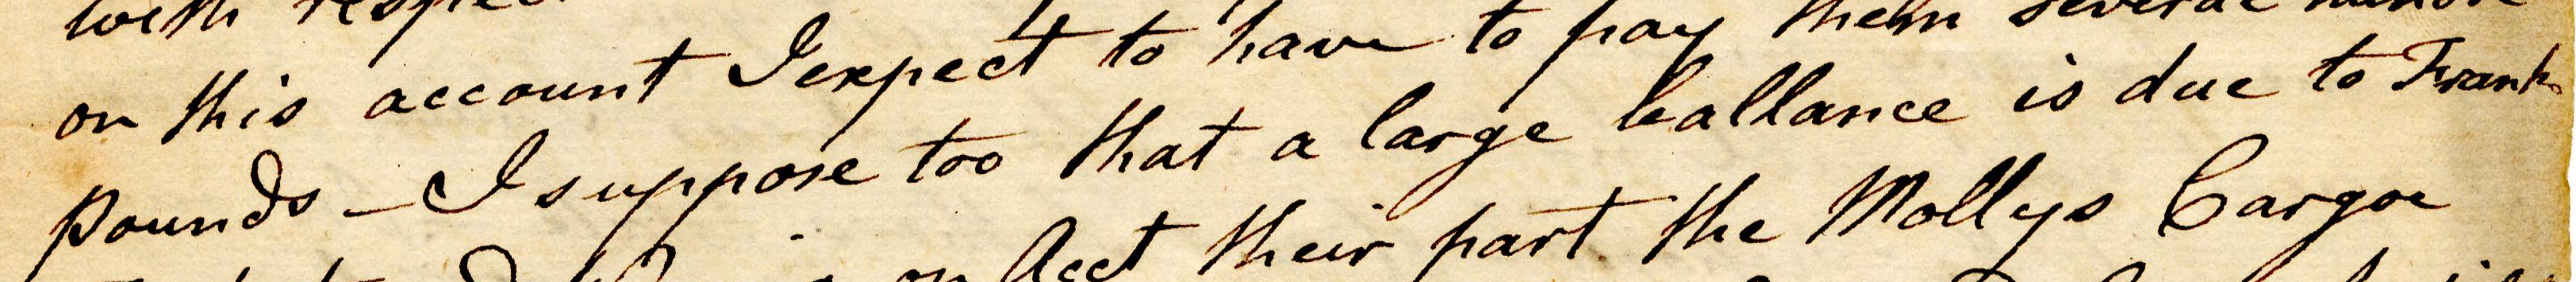pounds. I suppose too that a large ballance is due to Frank
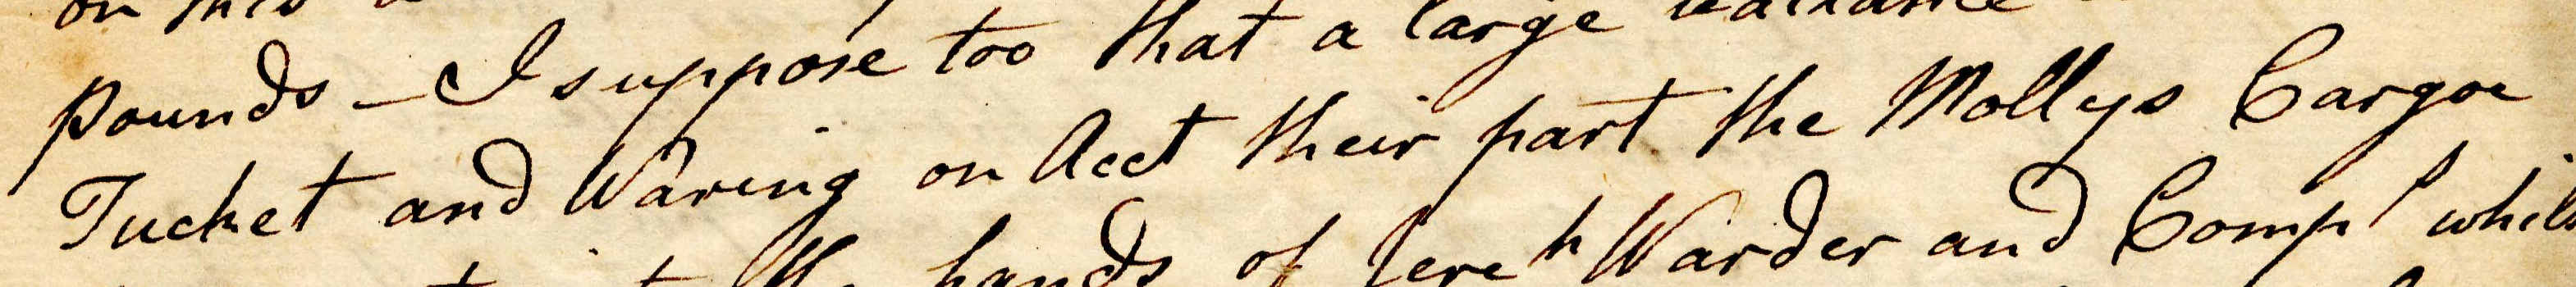Tucket and Waring on Acct their part the Mollys Cargoe
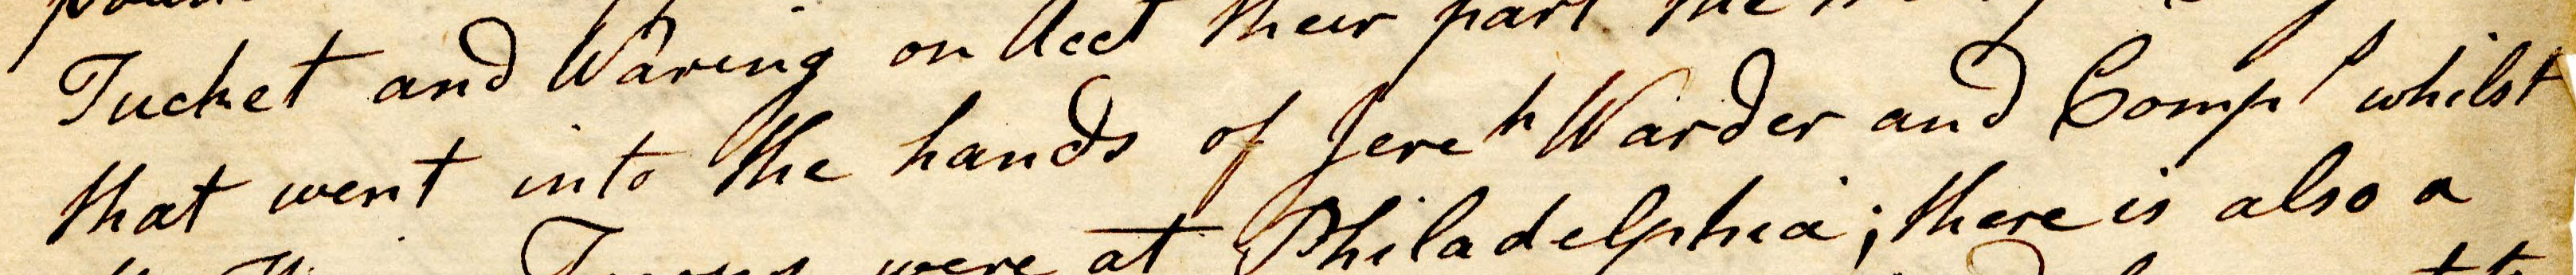that went into the hands of Jere^h Warder and Comp^y whilst
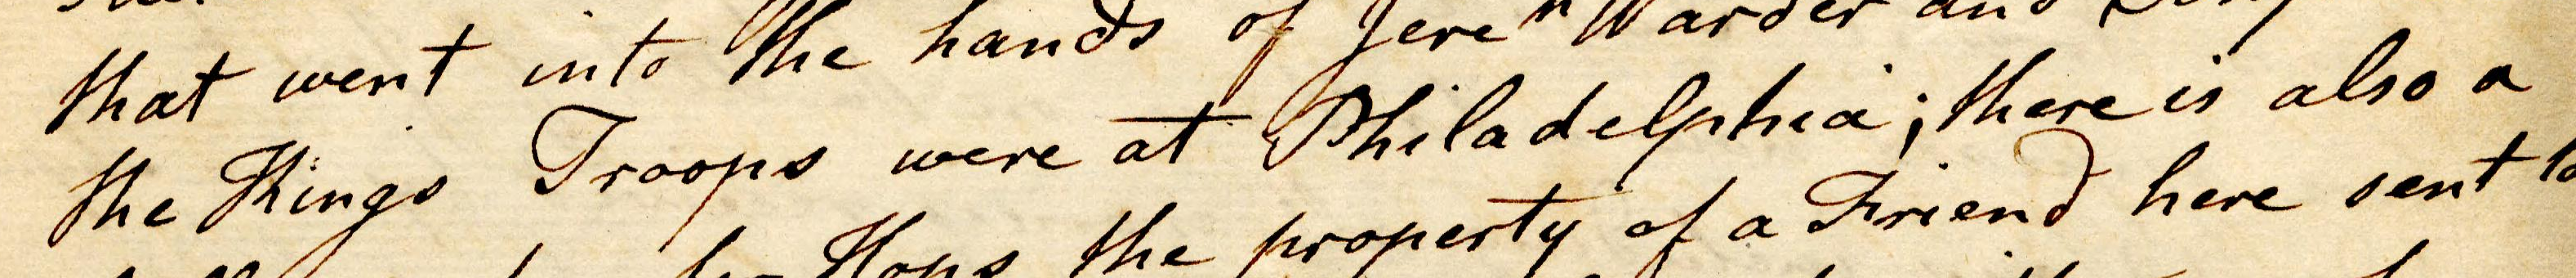the Kings Troops were at Philadelphia; there is also a
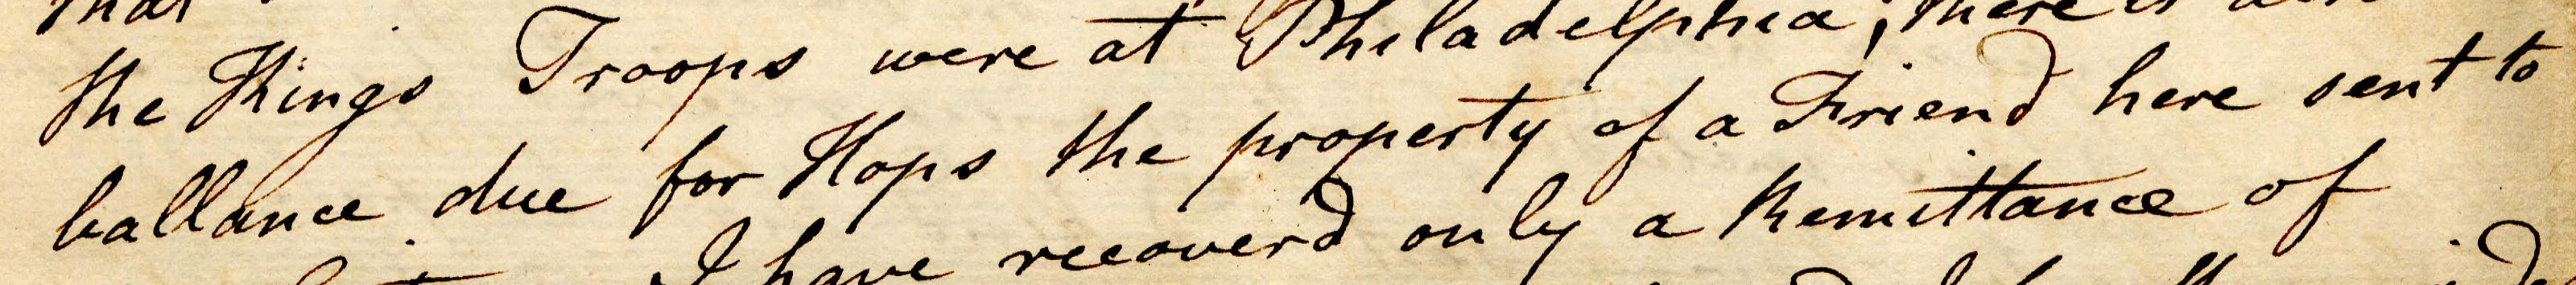ballance due for Hope the property of a Friend here sent to
